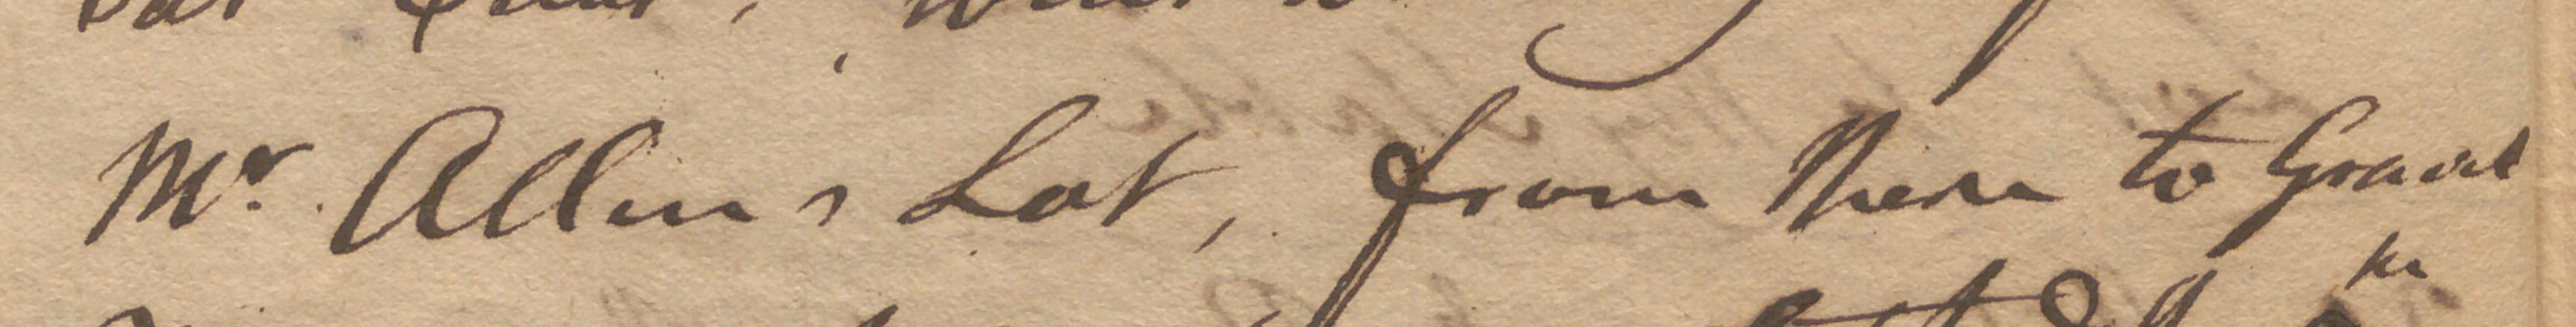M^r. Allens Lot, from there to Gravel
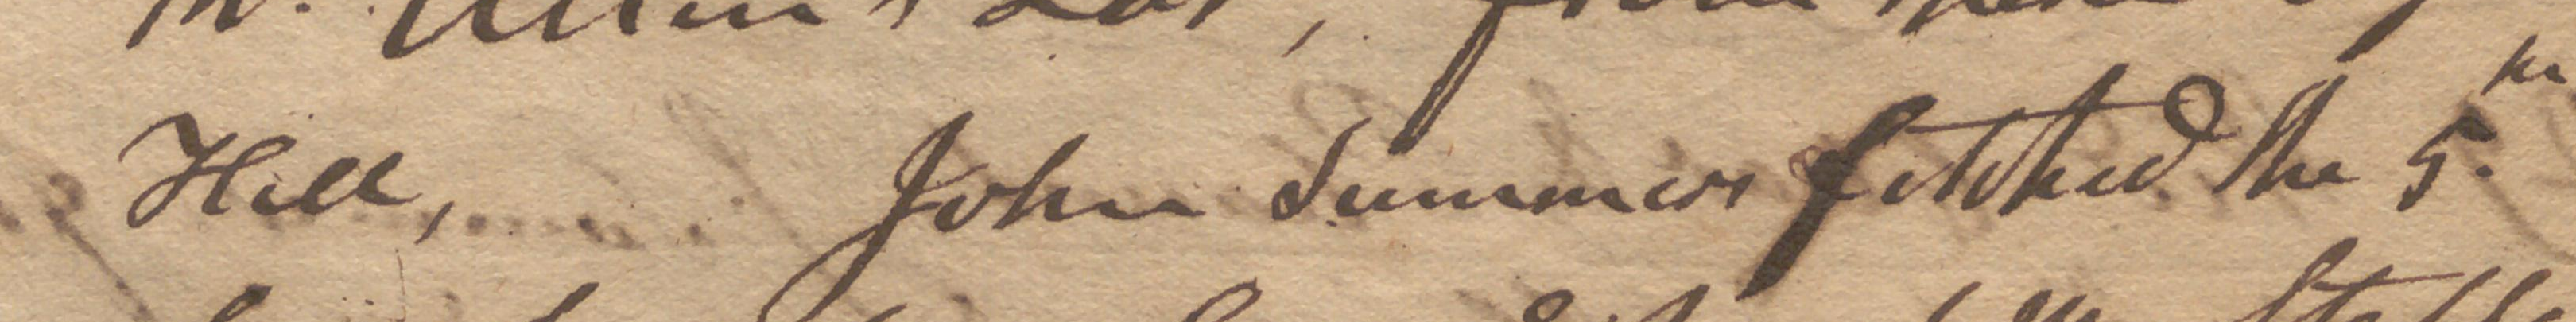Hill, John Summers fetched the 5^th.
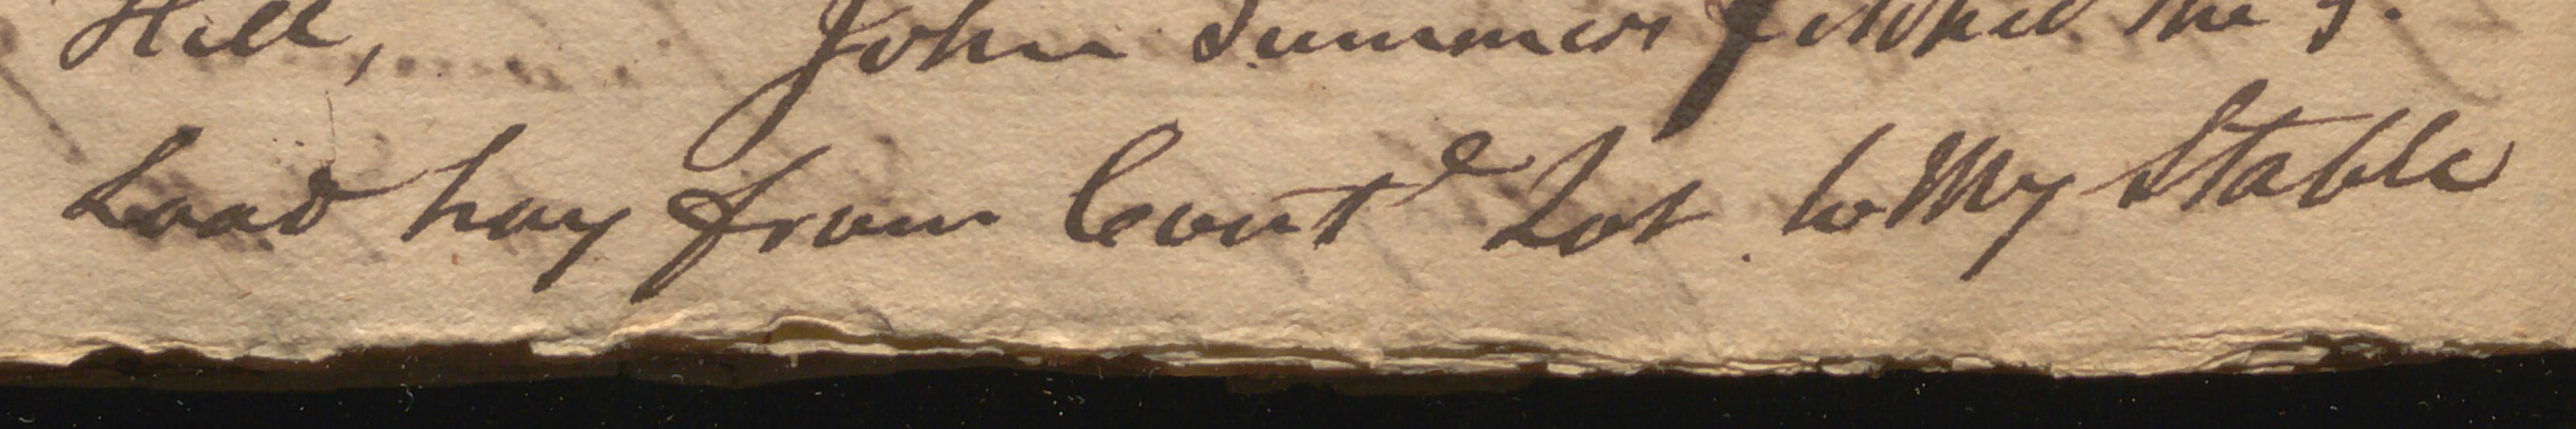Load hay from Cont^t Lot to My Stable
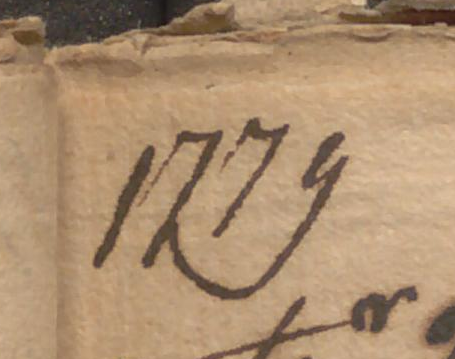1779
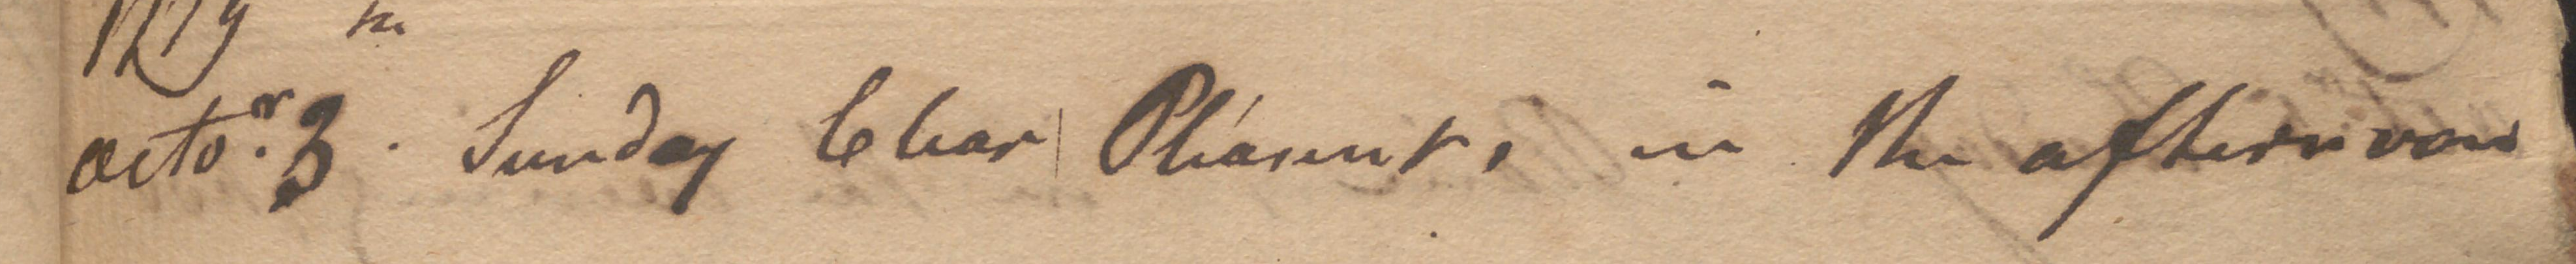Octo^r. 3^th. Sunday Clear Pleasent, in the afternooon
